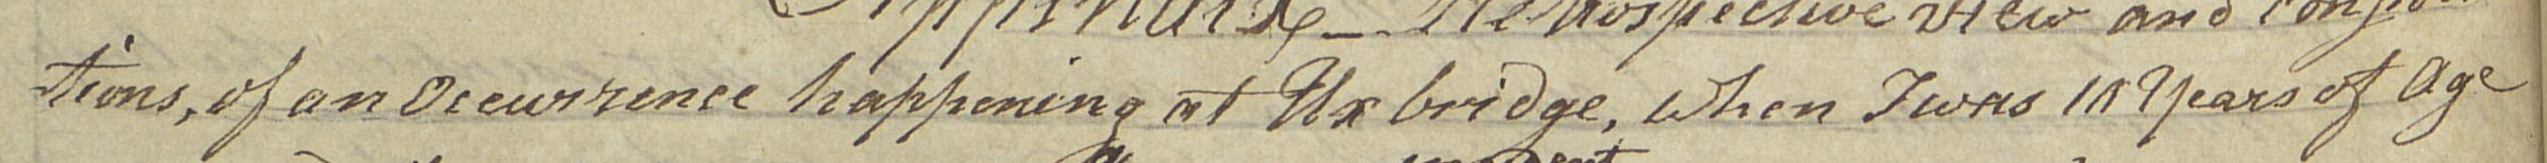-tions, of an Occurrence happening at Uxbridge, when I was 10 Years of Age
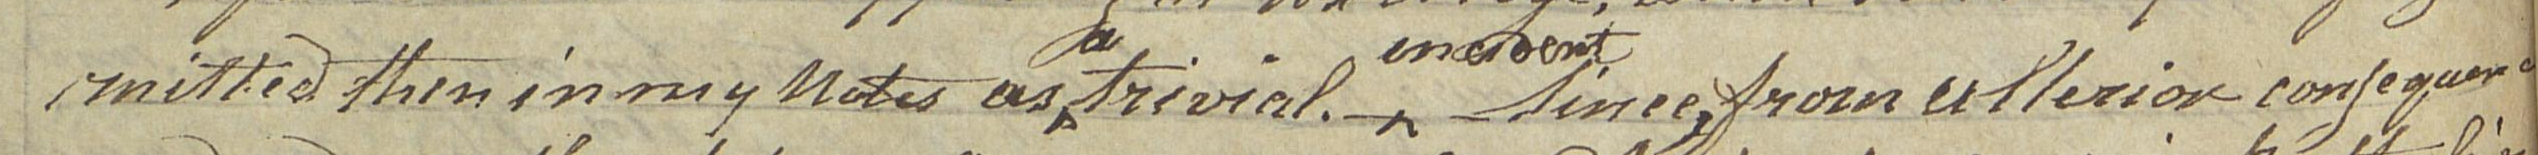unitled then in my notes as ^ trivial.^ Since from ulterior consequence
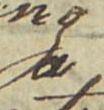a
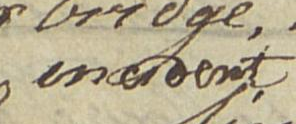incident
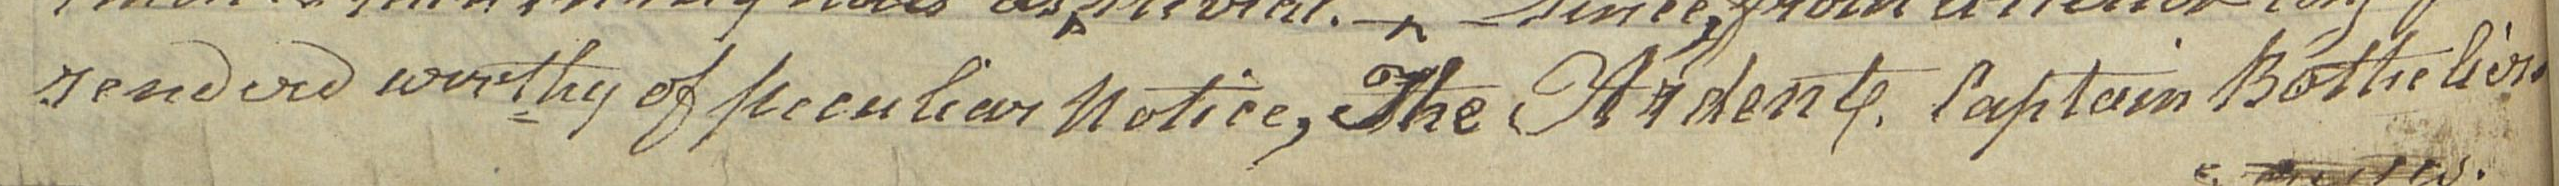renderd worthy of peculiar Notice, The Ardent, Captain Bothelier
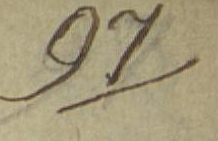97
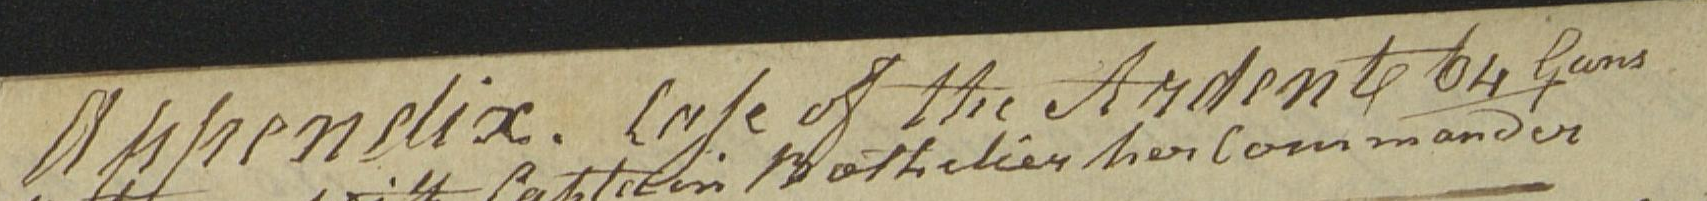Appendix. Case of the Ardent 64 Guns
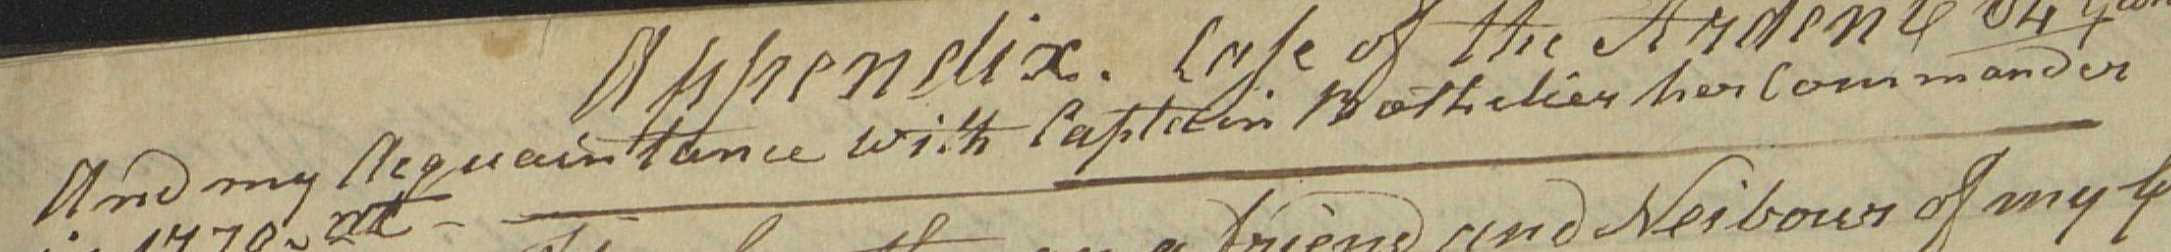And my Acquaintance with Captain Bothelier her Commander
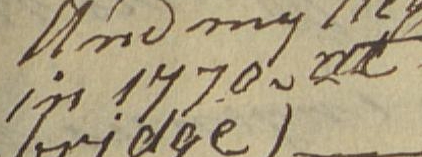in 1770 at
